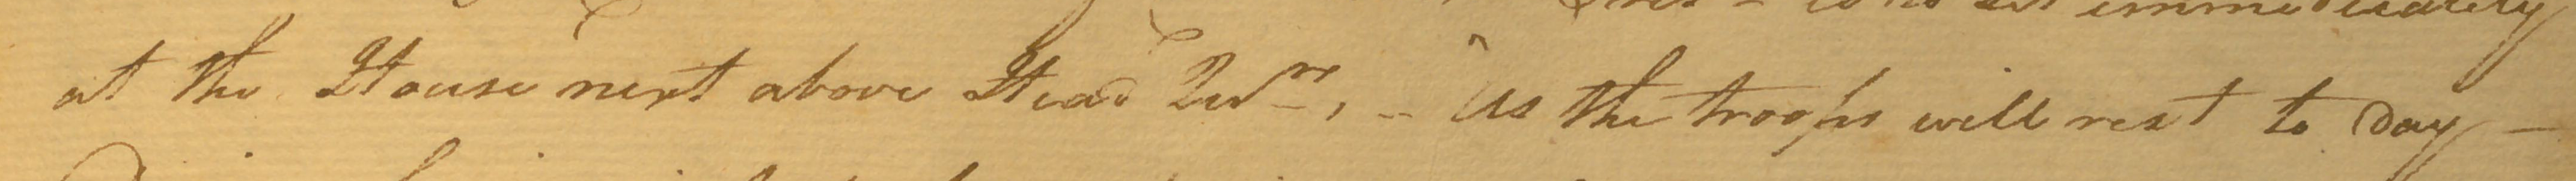at the House next above Head Qu^rs, as the troops will rest to day-
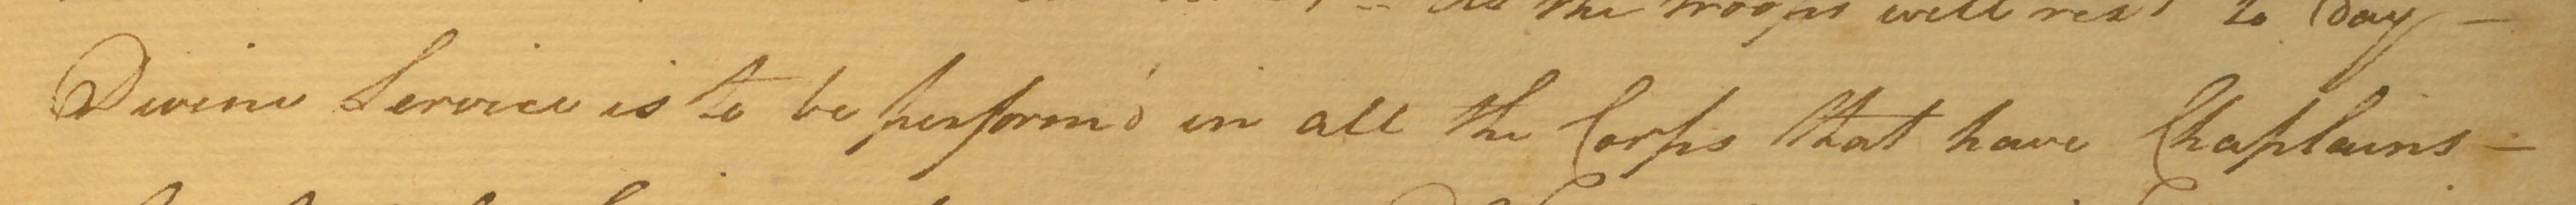Divine Service is to be perform'd in all the Corps that have Chaplains-
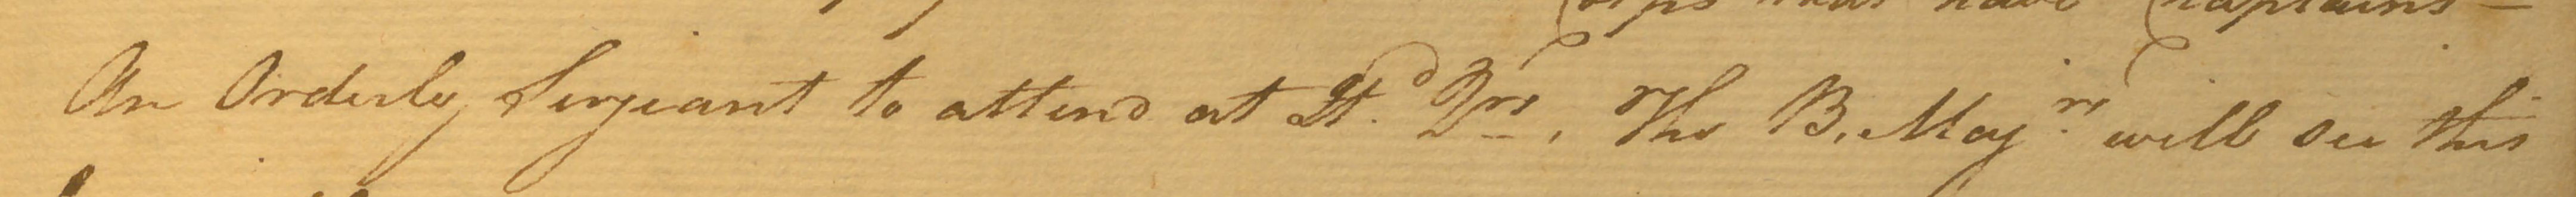An Orderly Serjeant to attend at H^d. Qu^rs. The B. Maj^rs will see this
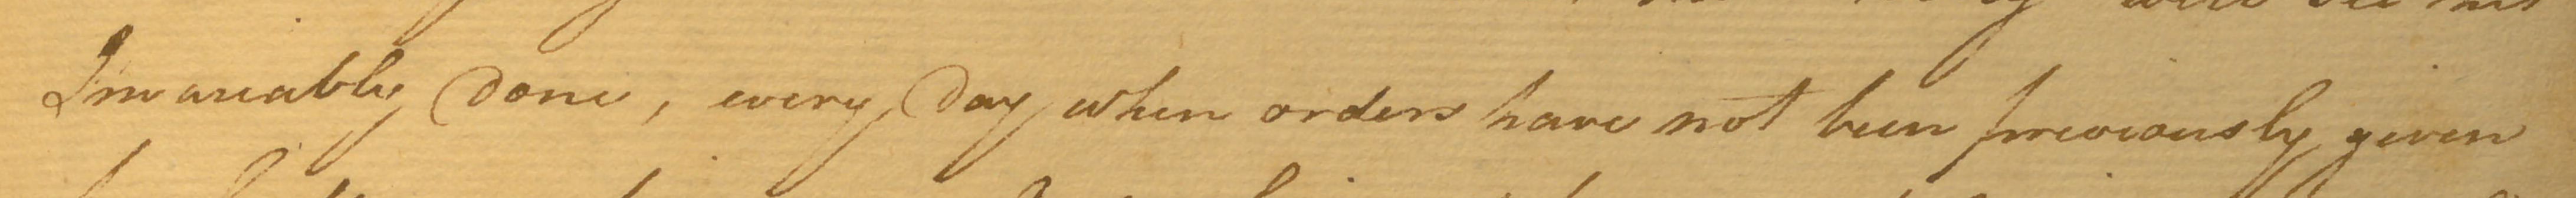Invariably done, every day when orders have not been previously given
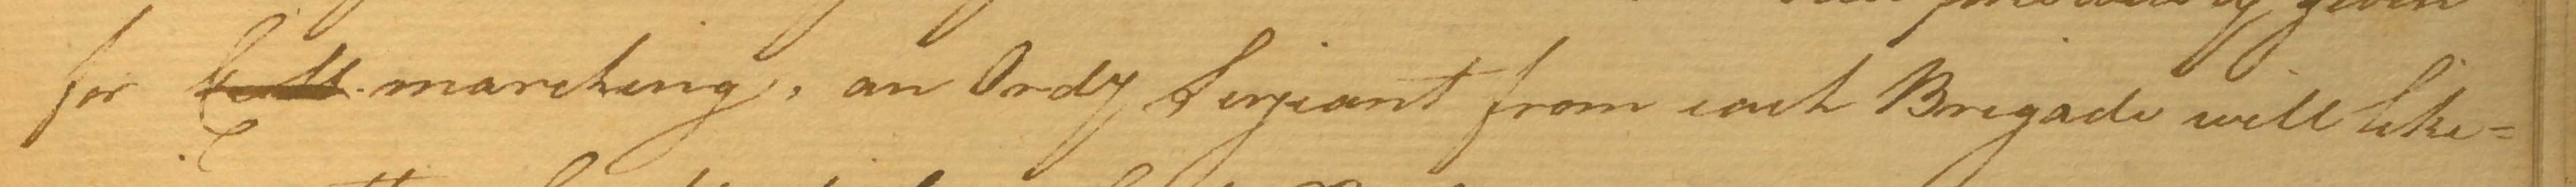for [____] marching, an Ord^y Serjeant from each Brigade will like-
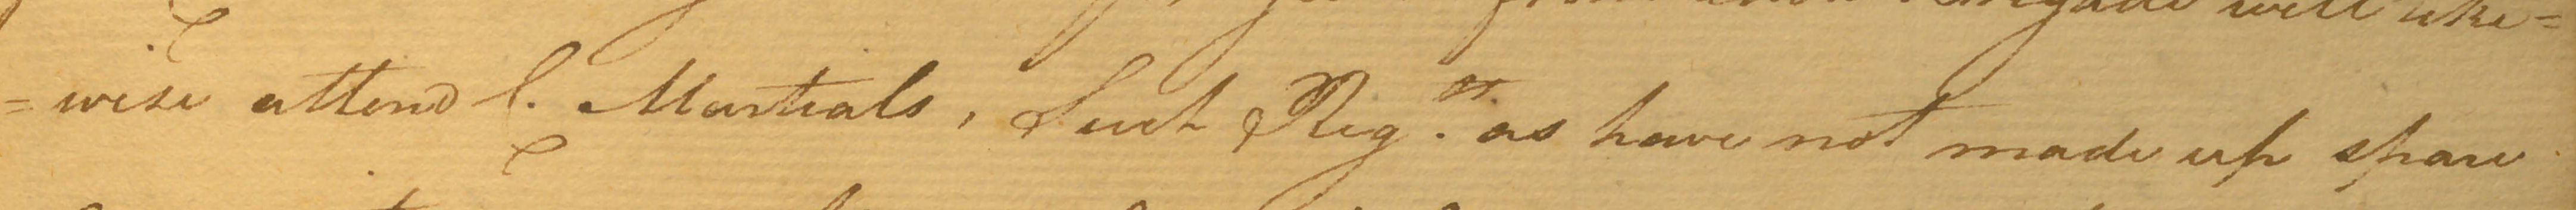-wise attend C. Martials.Such Reg^ts as have not made up spare
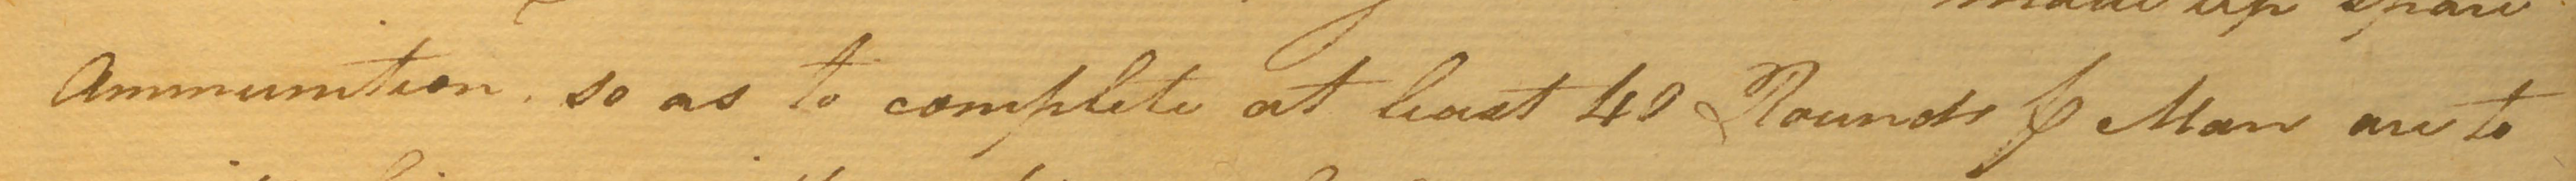Ammunition so as to complete at least 40 Rounds per Man are to
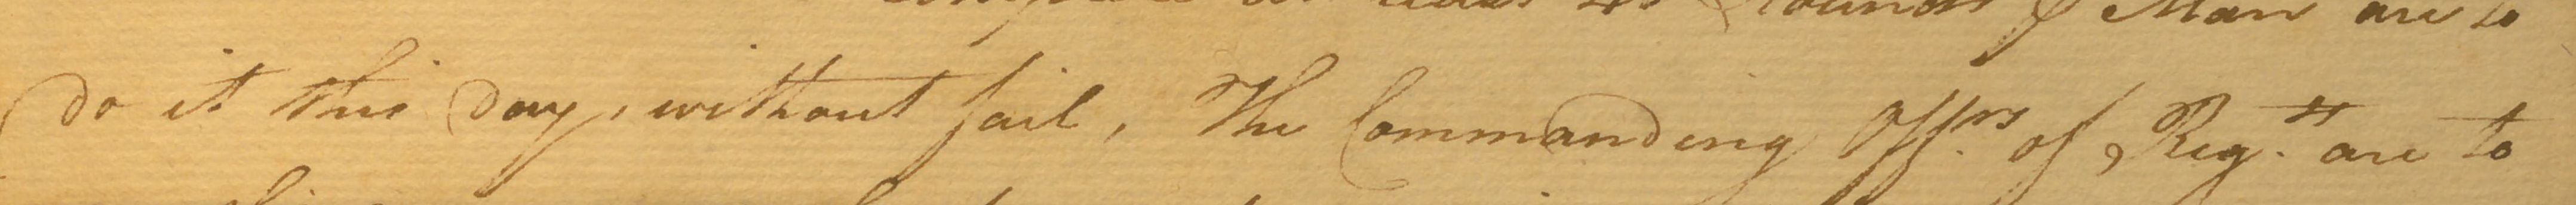do it this day without fail. The Commanding Off^rs. of Reg^ts. are to
